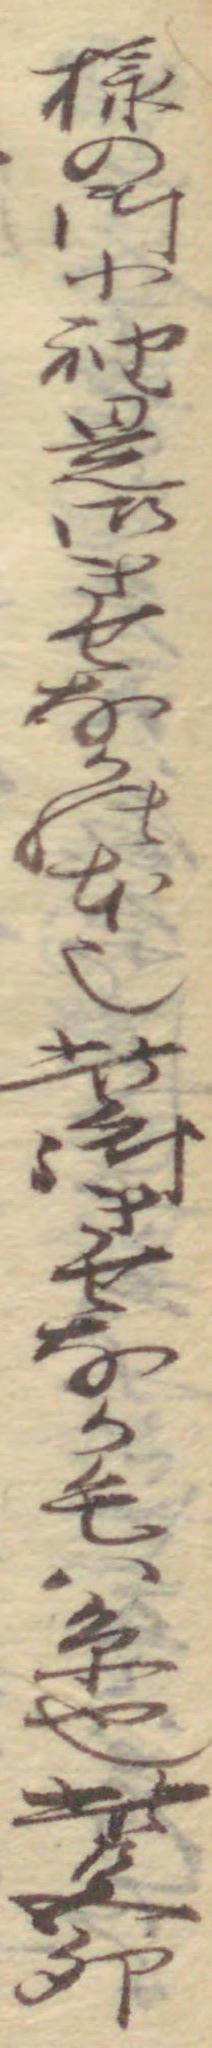様の御小袖是御きせなかの本也此御きせなか毛ハ糸也此色卯
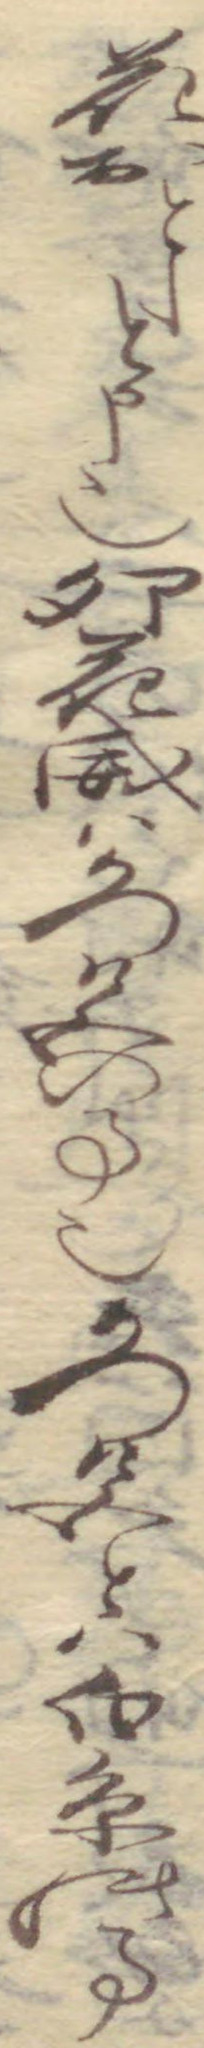花おとしと申也卯花威ハかつ色の事也かつ色とハ白糸の事
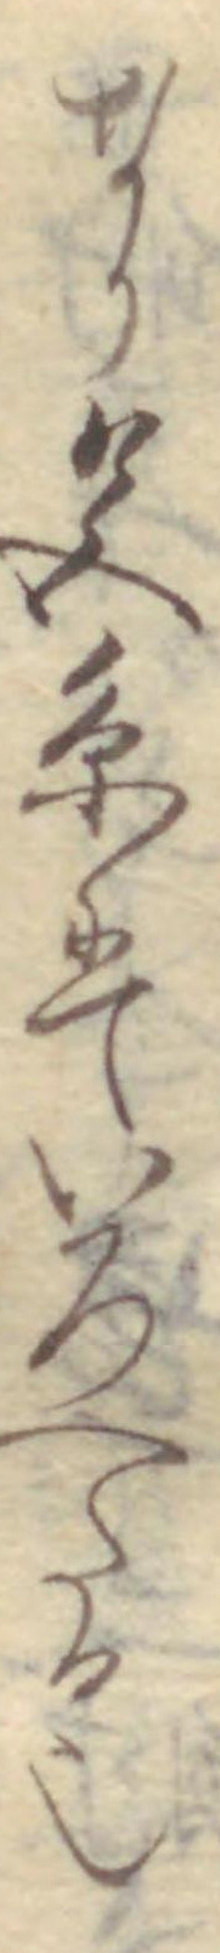なり色糸にていろへたる也
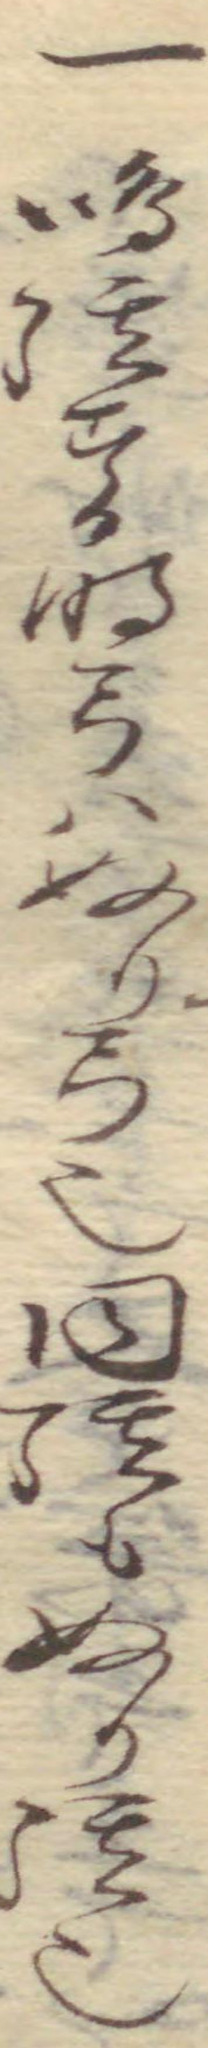一鳴弦する時弓ハぬり弓也同弦もぬり弦也
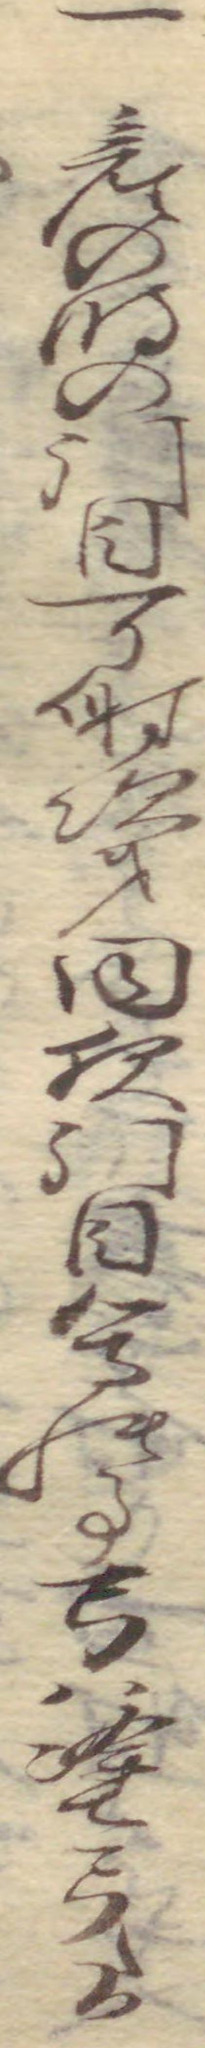一産の時の引目可射次第同様引目等の事弓ハ塗弓たる
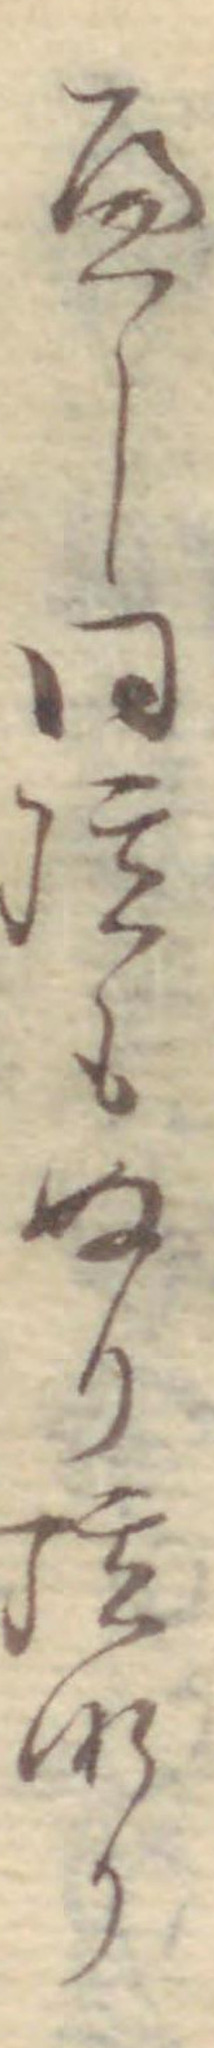へし同弦もぬり弦なり
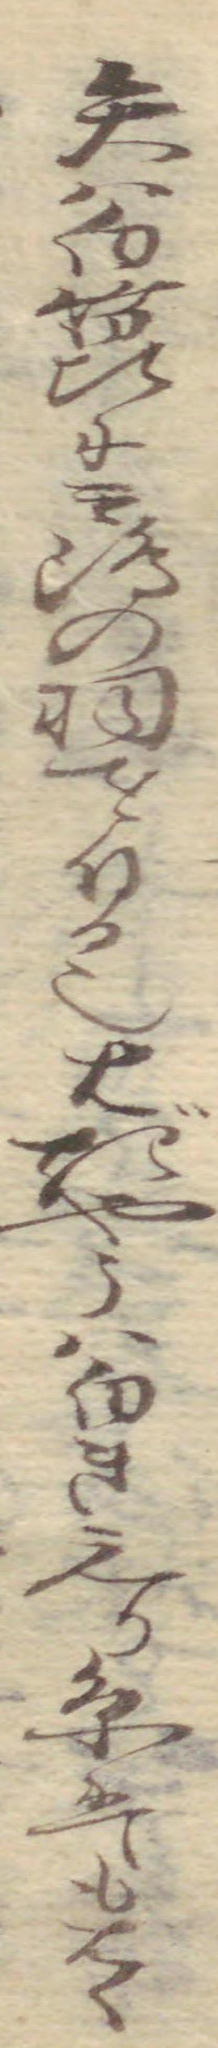一矢ハ白篦に鶴の羽を付る也はぎやうハ白きえり糸にてもはく
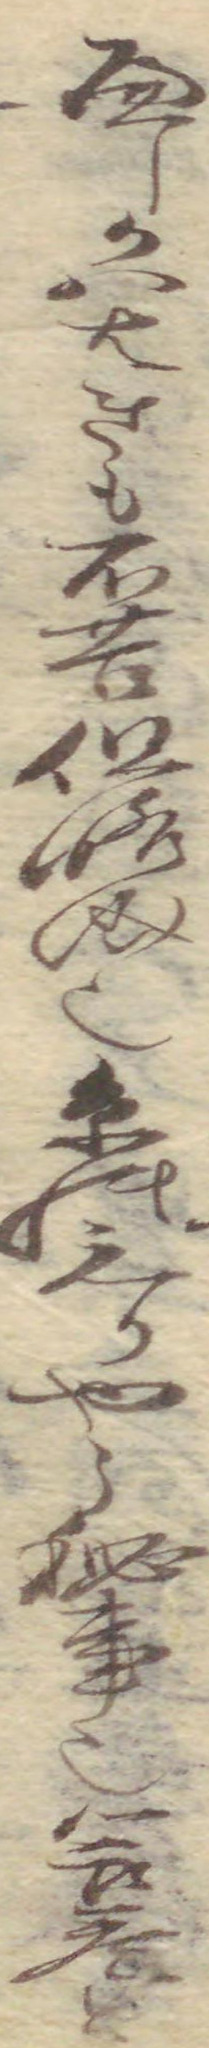へしかハはきも不苦但略儀也糸のえりやう秘事也筈巻と
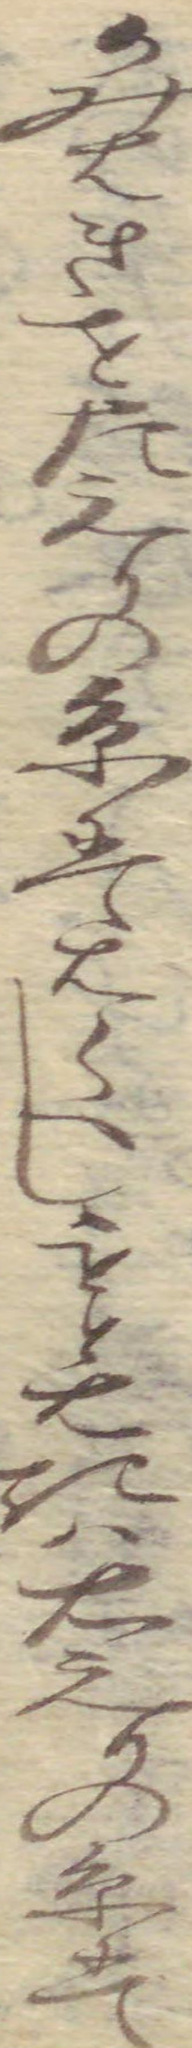かみはきを左えりの糸にてはくへしもとはきハ右えりの糸にて
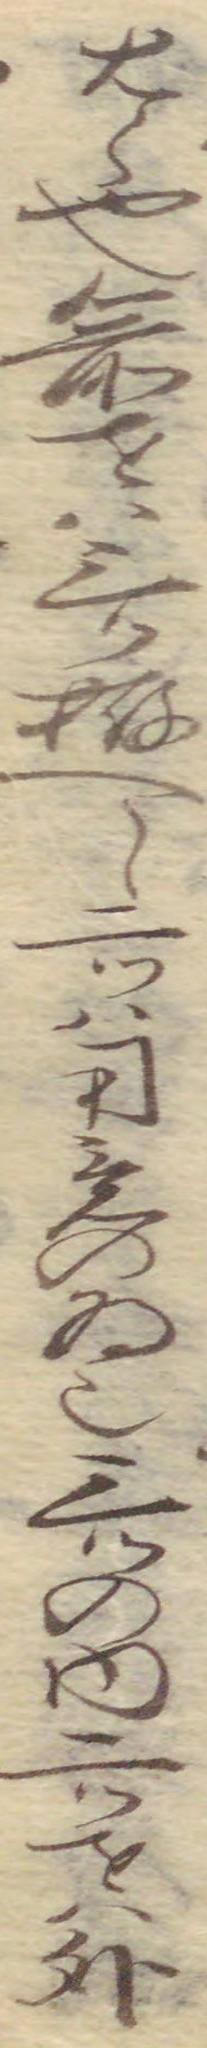はく也箭をハ三ツ拵へし二ツハ用意の為也三ツの内二ツをハ外
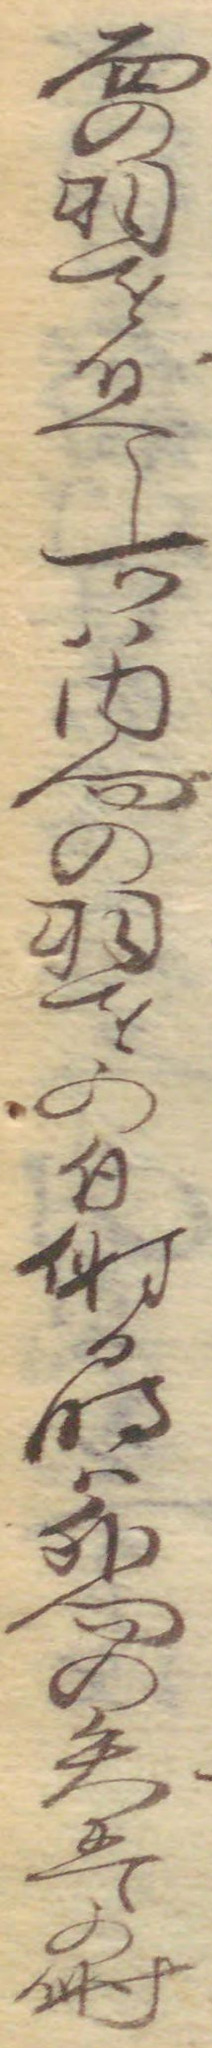面の羽を付へし一ツハ内向の羽を可付射る時ハ外向の矢にて可射

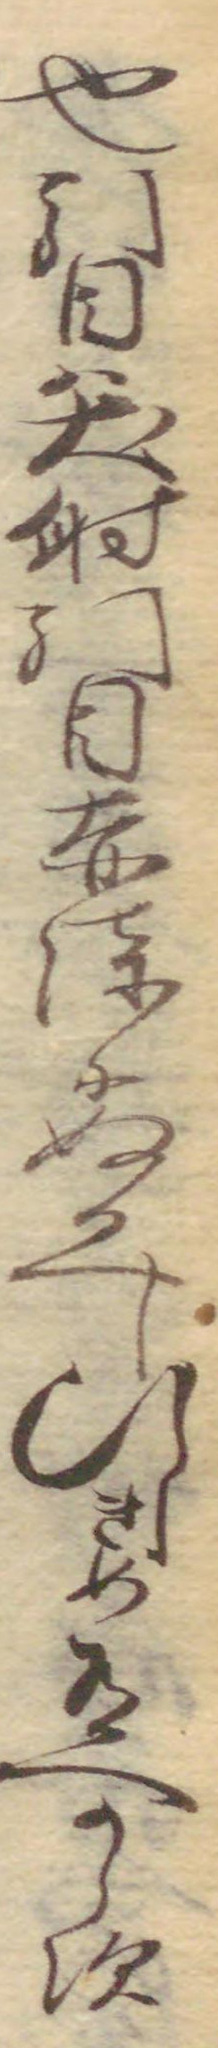也引目ハ犬射引目赤漆にぬるへしひしきめ有へかたす
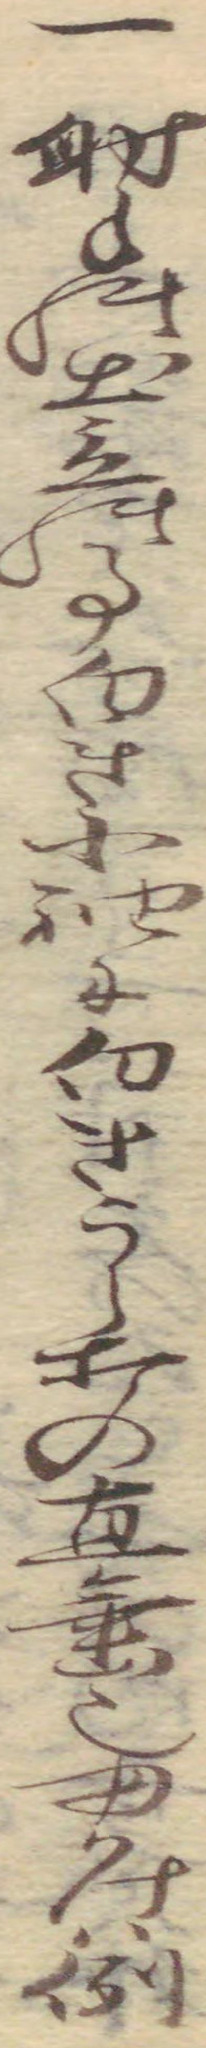一射手の出立の事白き小袖に白きうら打の直垂也ゆかけハ例
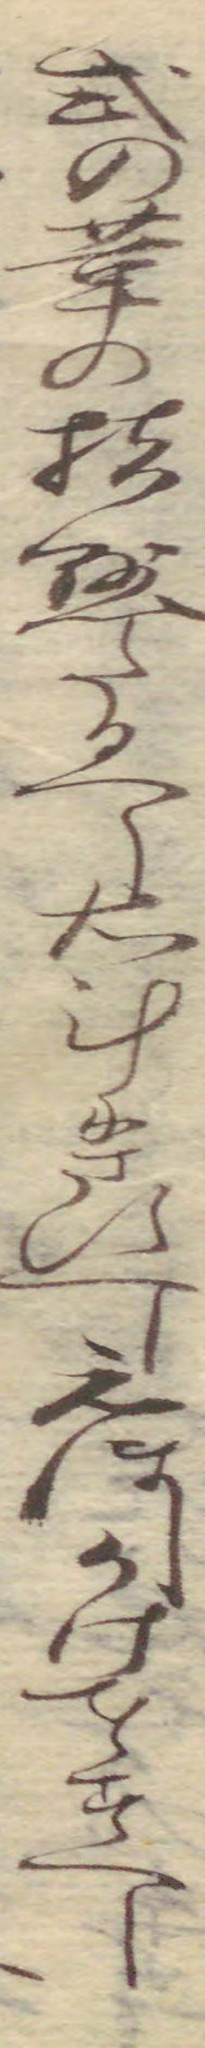式の革の指懸たるへし右斗にさすへしえほしかけをすへし
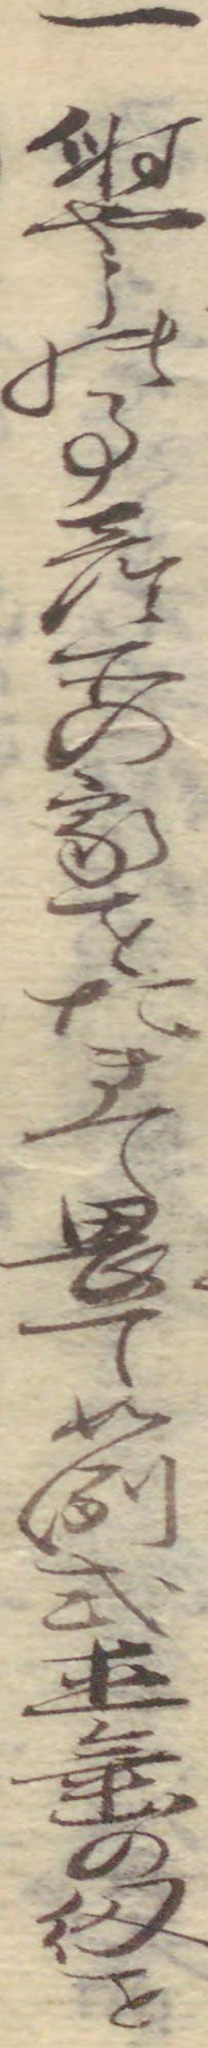一射やうの事産所の家をたきて畏て例式直垂の紐を
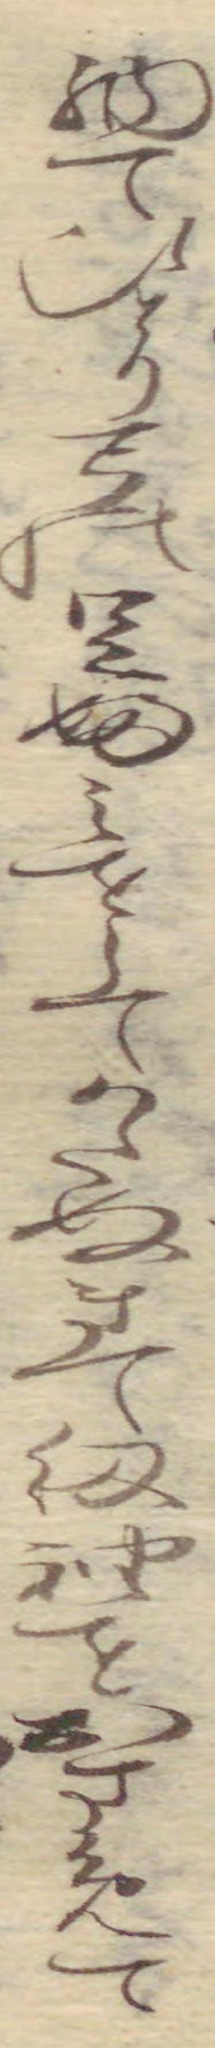納てひとり弓の足ふミをしてかたぬきて紐袖をおさめて
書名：鶯宿雑記. 巻199-200
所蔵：国立国会図書館 National Diet Library, JAPAN
